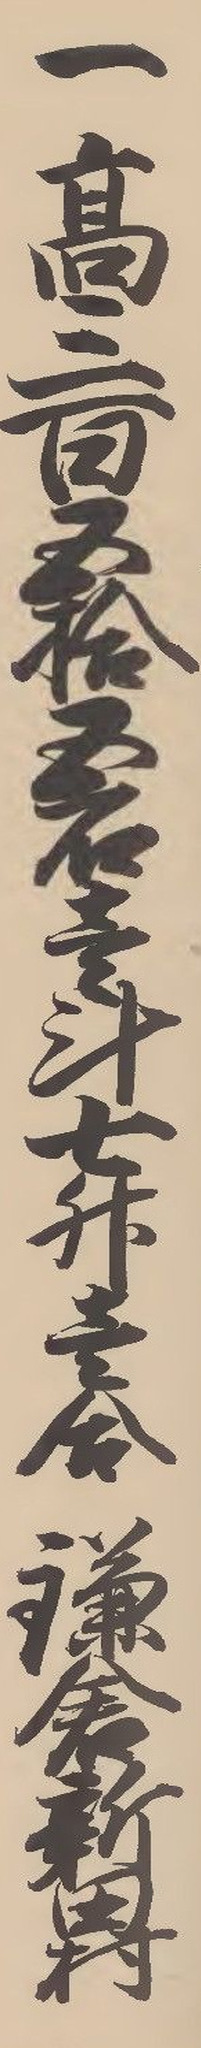一高三百五拾五石壱斗七升壱合鎌倉新田村
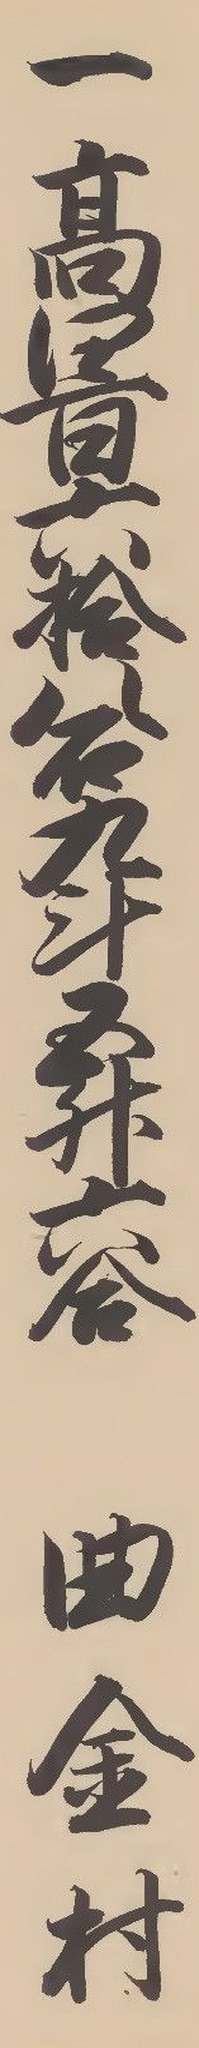一高四百六拾八石九斗五升六合曲金村
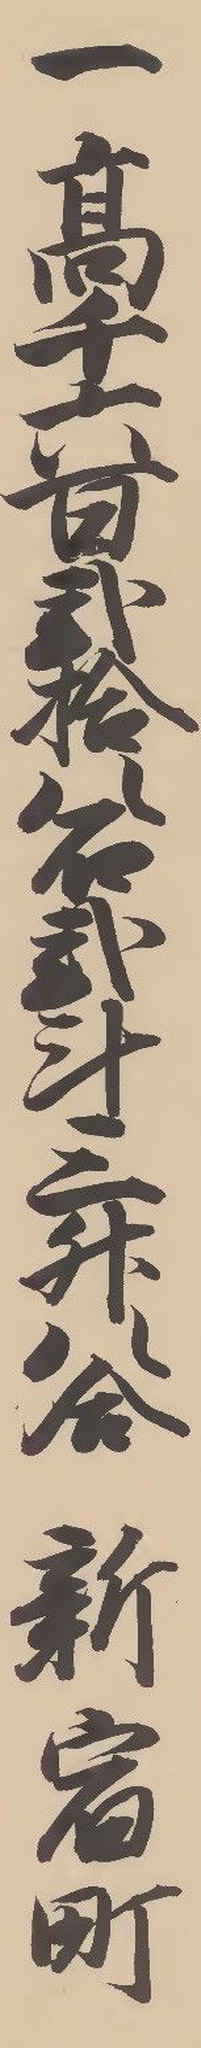一高千六百弐拾八石弐斗三升八合新宿町
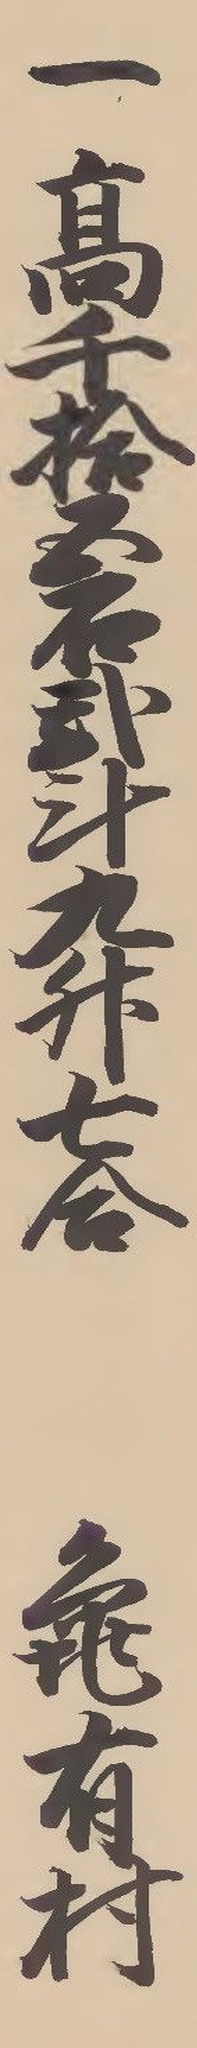一高千拾五石弐斗九升七合亀有村

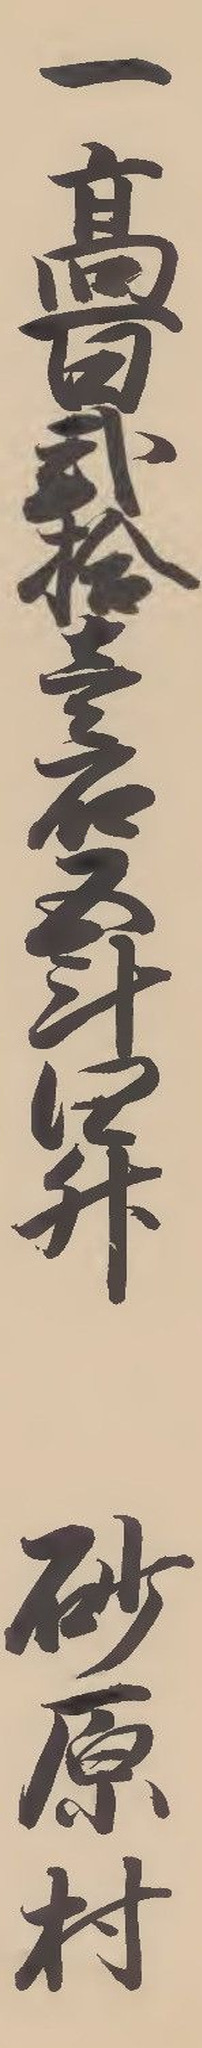一高百弐拾壱石五斗四升砂原村
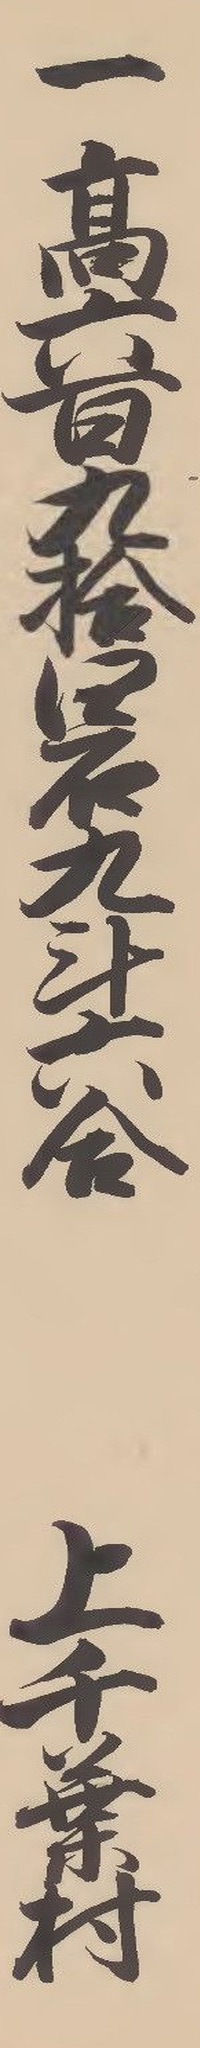一高六百九拾四石九斗六合上千葉村
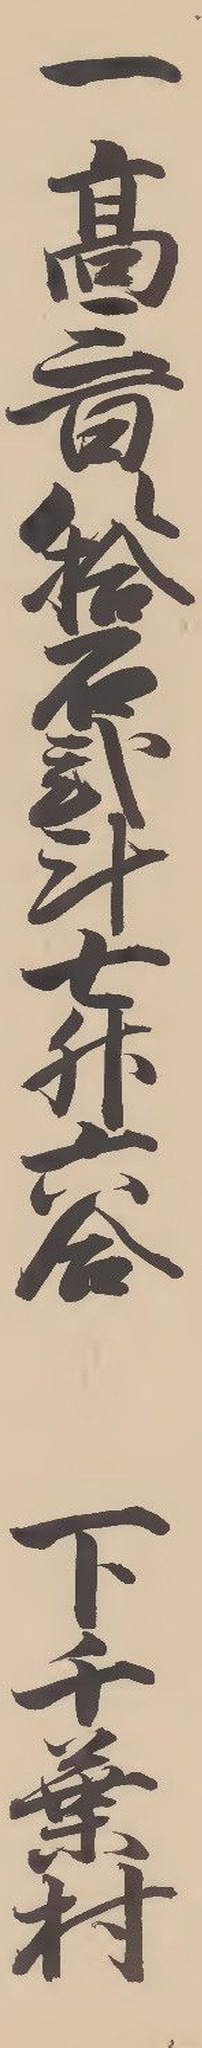一高三百八拾石弐斗七升六合下千葉村
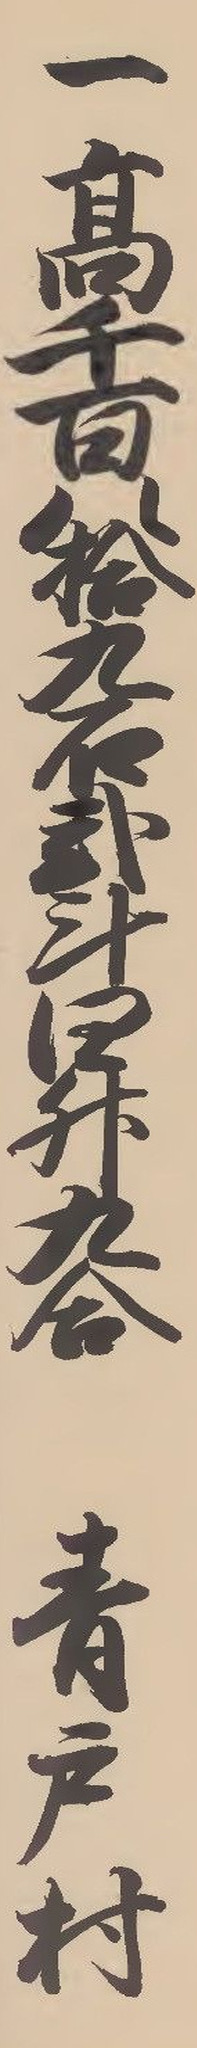一高千百八拾九石弐斗四升九合青戸村
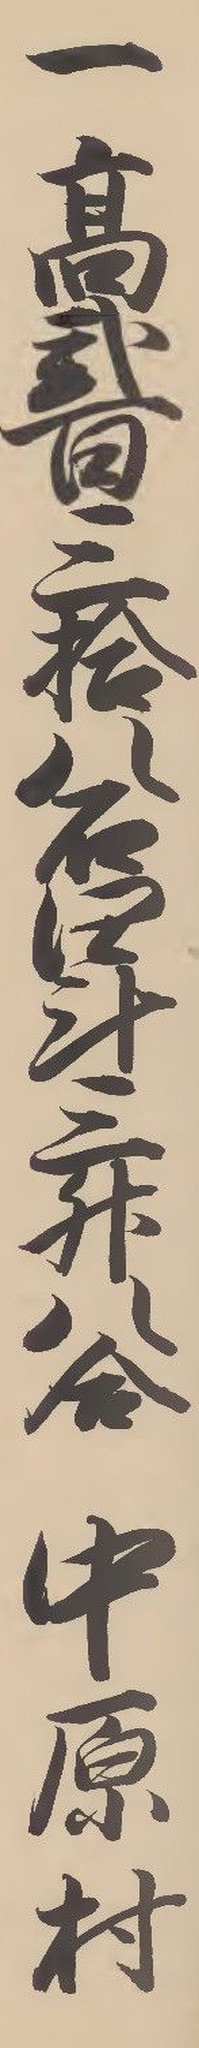一高弐百三拾八石四斗三升八合中原村
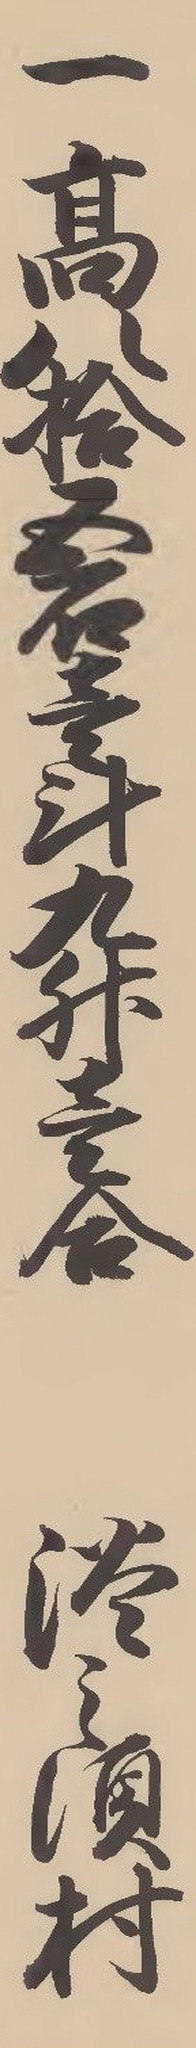一高八拾五石壱斗九升壱合淡之須村
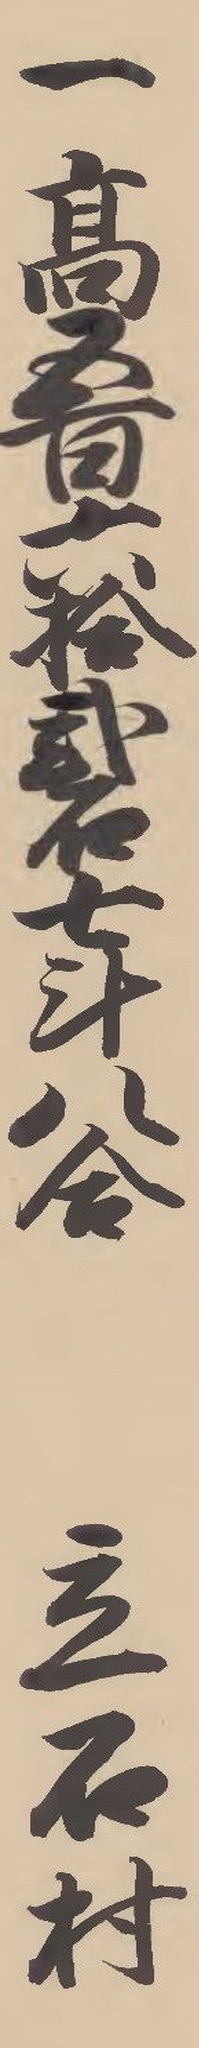一高五百六拾弐石七斗八合立石村
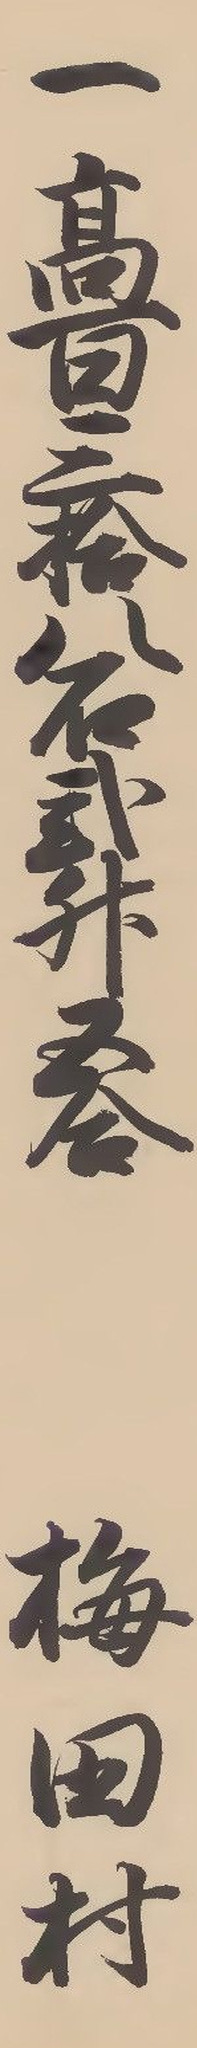一高百三拾八石弐升五合梅田村

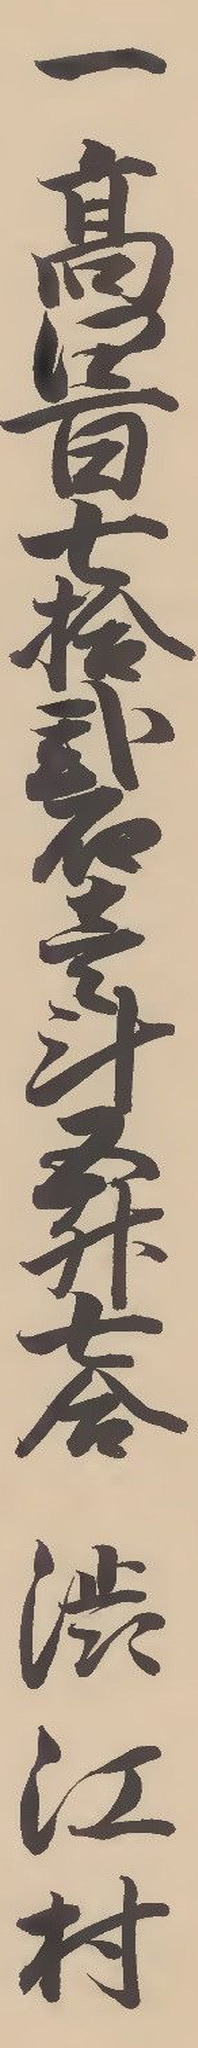一高四百七拾弐石壱斗五升七合渋江村
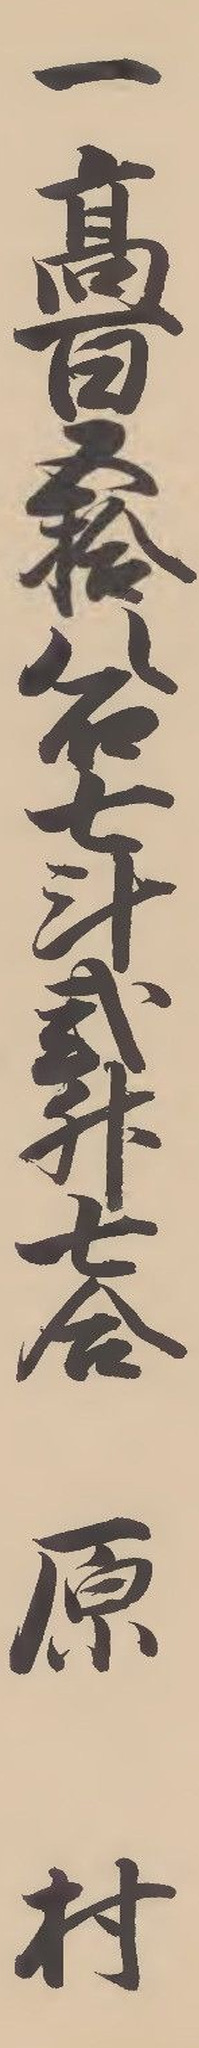一高百五拾八石七斗弐升七合原村
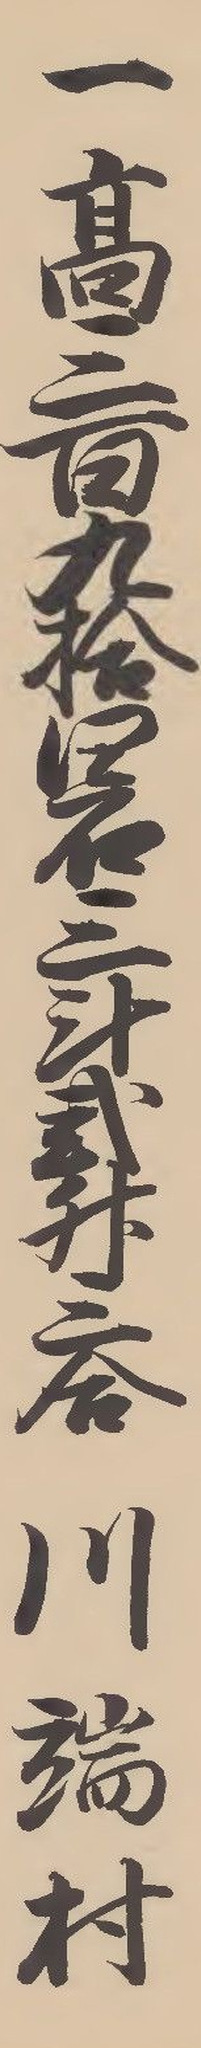一高三百九拾四石三斗弐升三合川端村
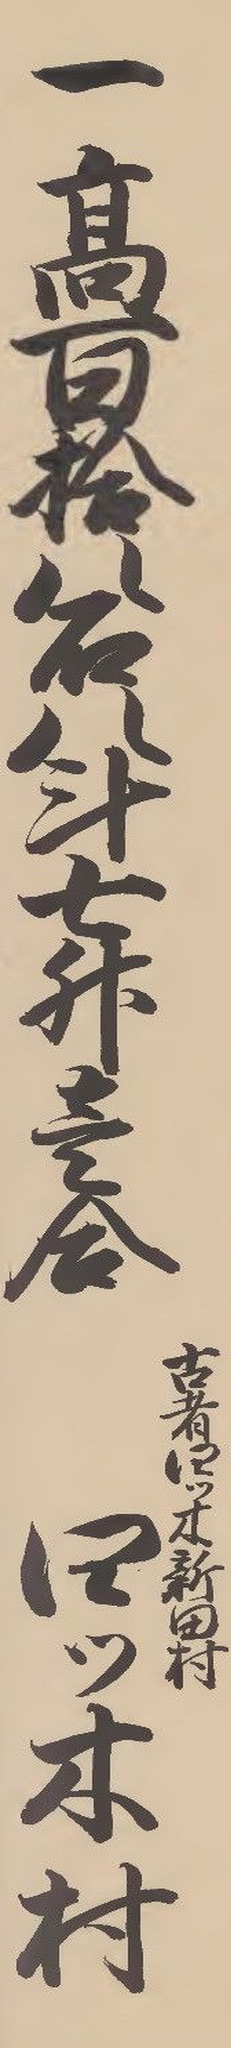一高百拾八石八斗七升壱合四ッ木村
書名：武蔵国郷帳　下
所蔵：国立公文書館 National Archives of Japan
